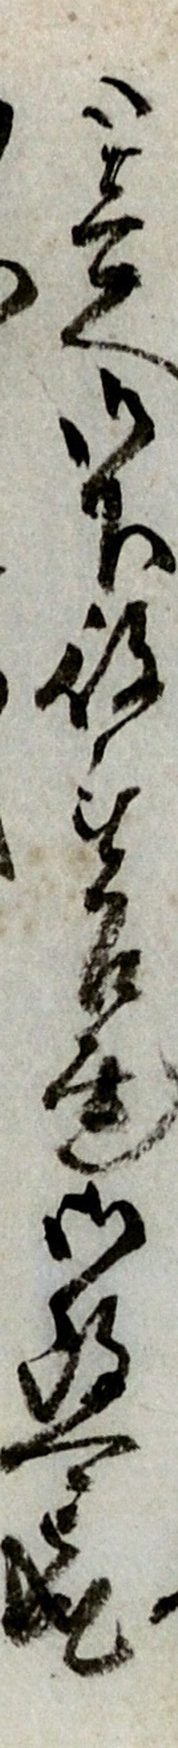御壱人御下役被召置御改可被成候
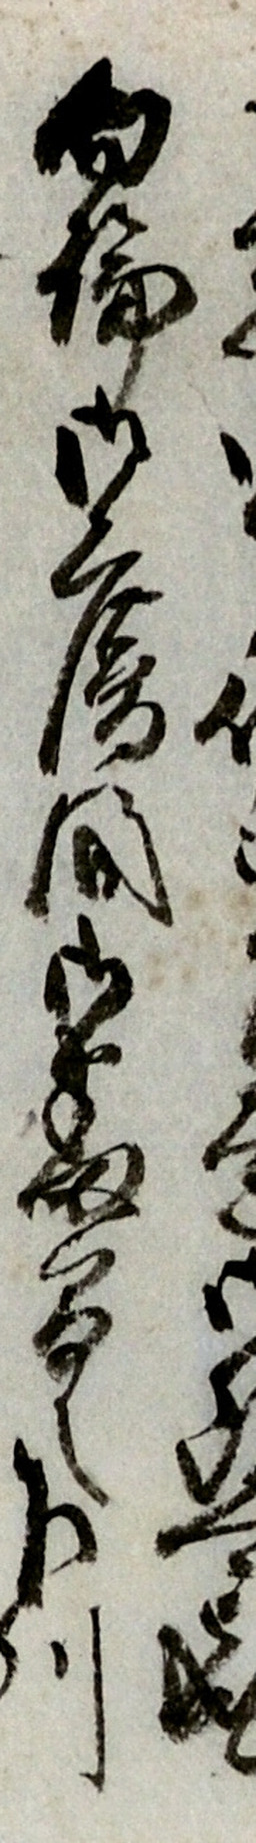勿論御広間御番間之下川
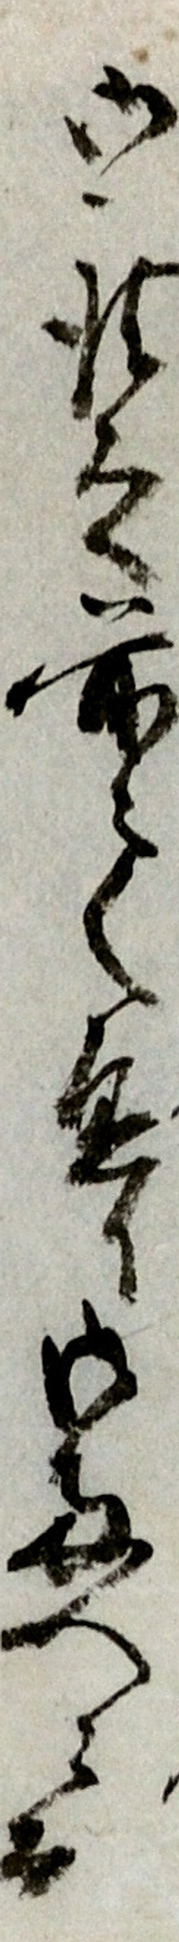御座候ハヽ前々之通り御両人ニ而
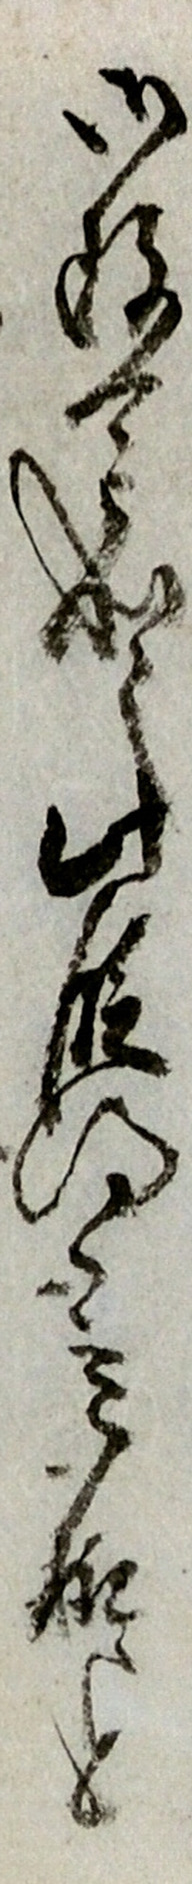御改可被成候此段得御意候様にと
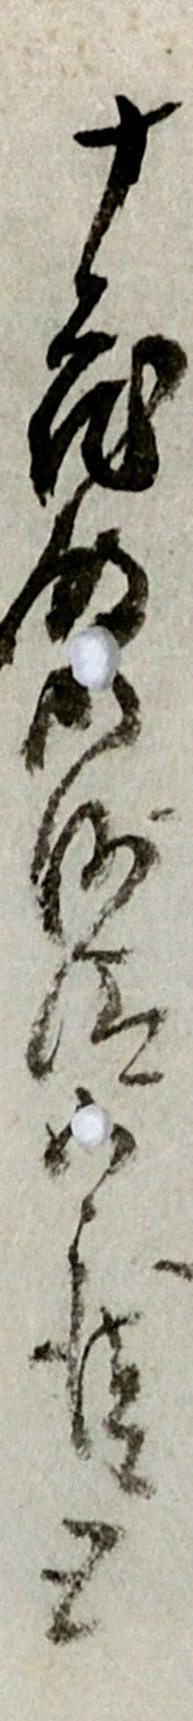十蔵殿御沙汰御座候以上
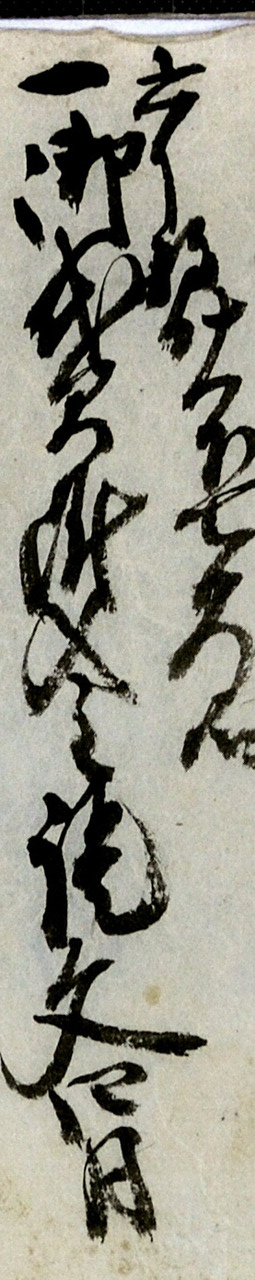一御貸附金証文四月
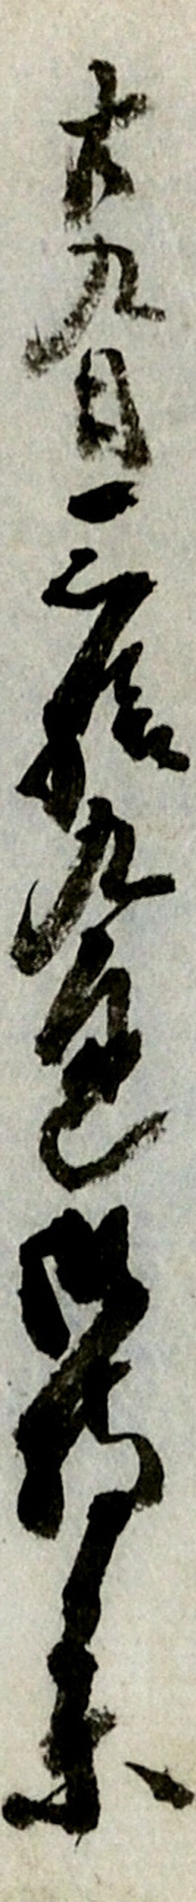廿九日三拾九通御持参
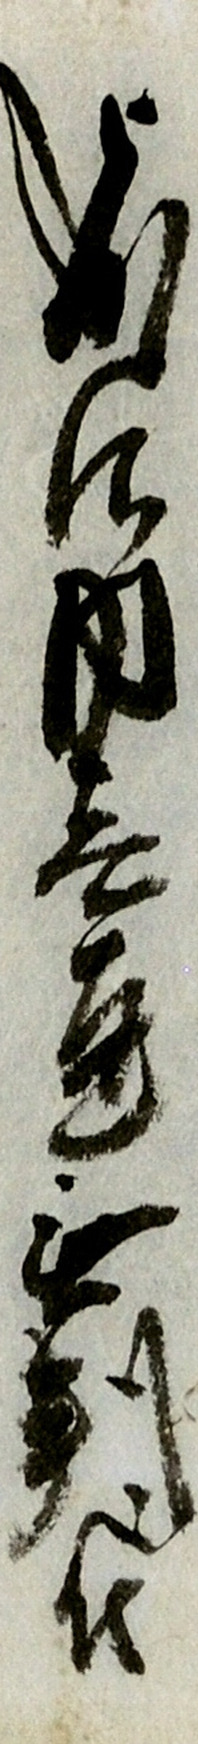被成候内壱通無判に付
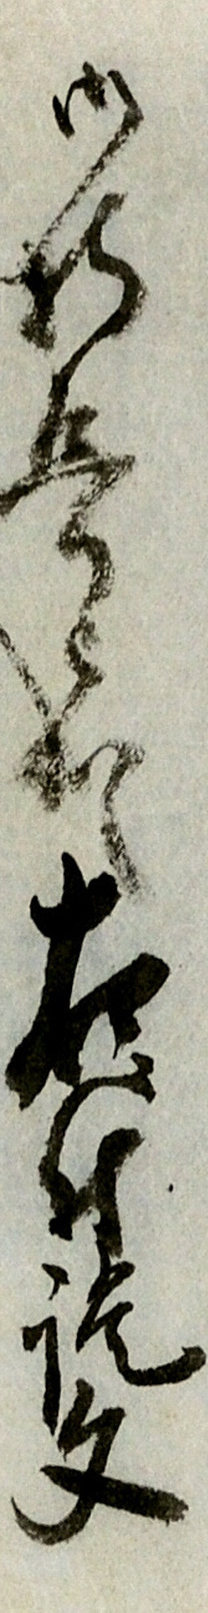御持返り被成候右に付証文
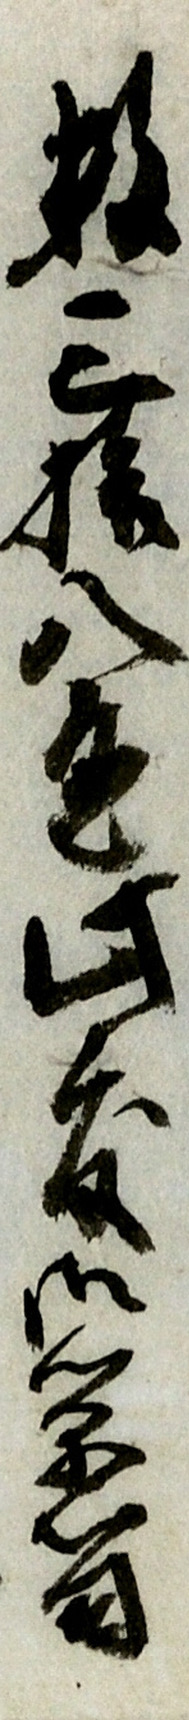数三拾八通此度御箪笥
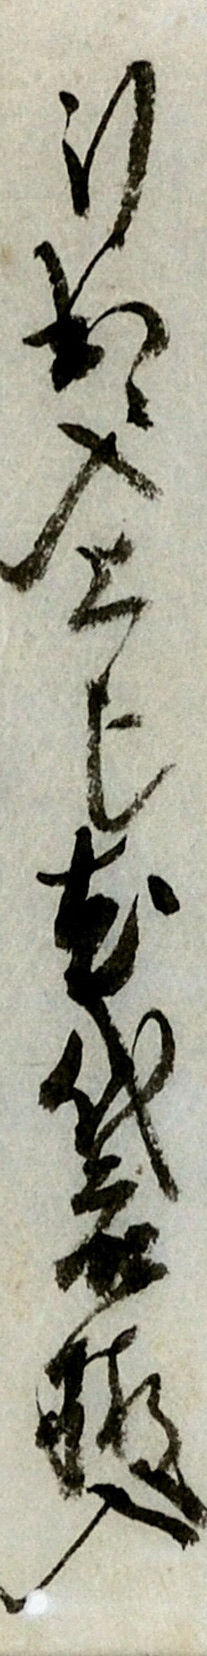引出に入上申候尤袋拵入
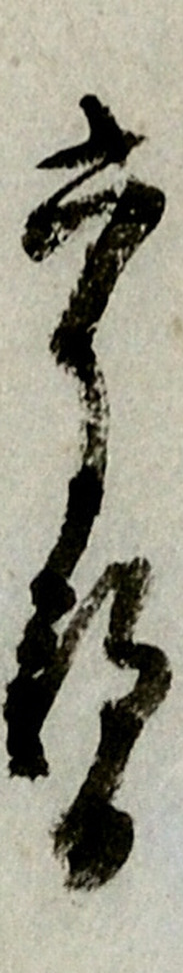六月朔日
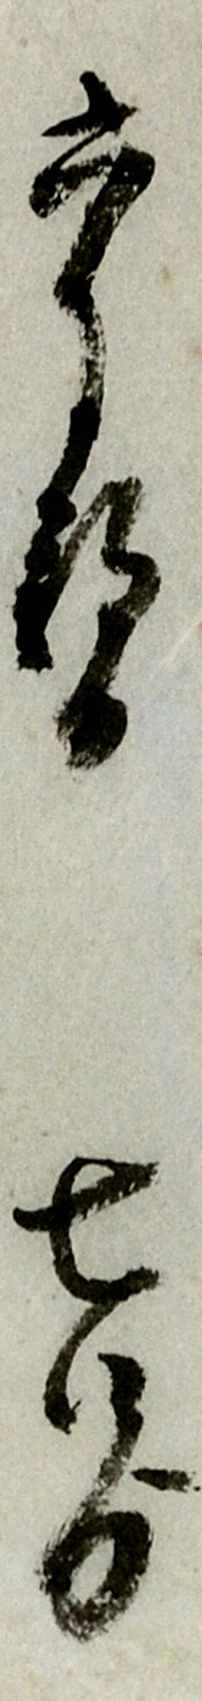六月朔日七左衛門
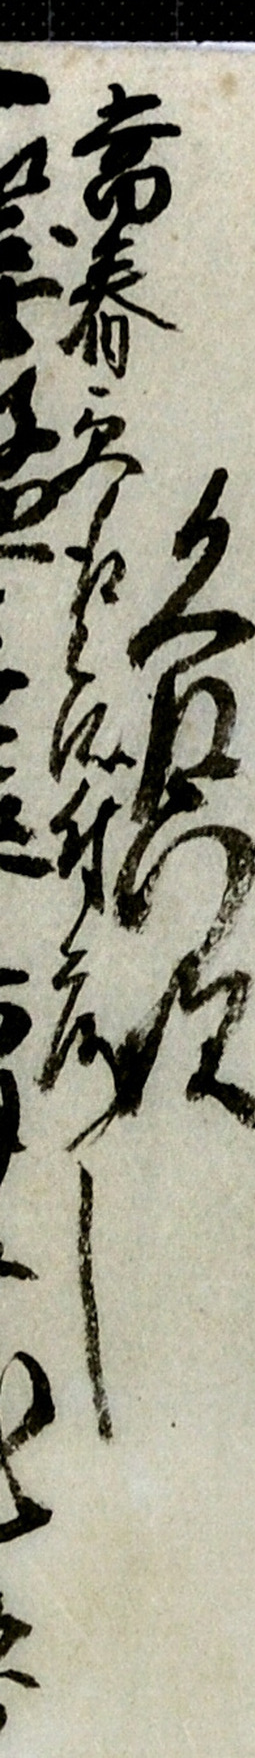当春受取候所付落し
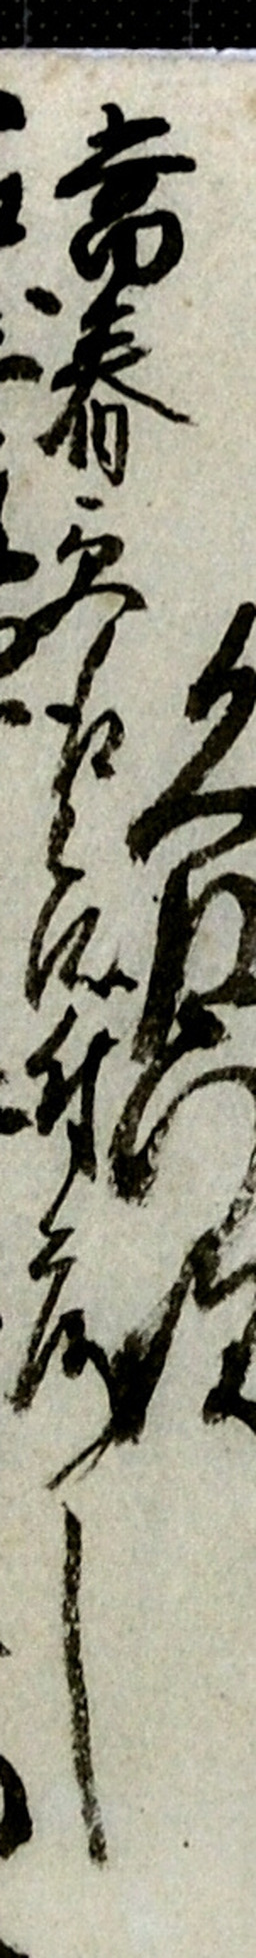当春受取候所付落し
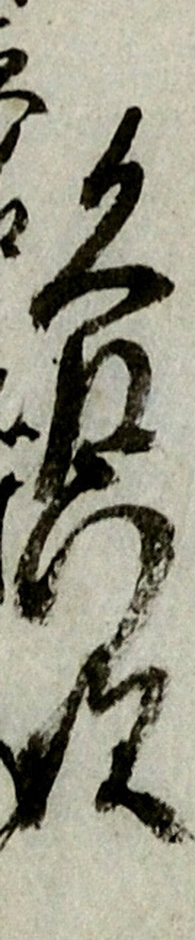久左衛門様
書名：分一方諸事御用留帳
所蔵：伊那市立高遠町図書館・合同会社AMANE
